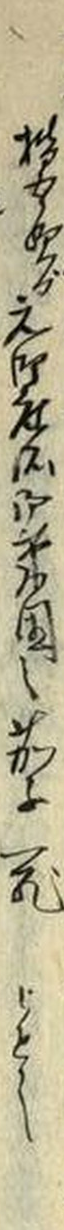揩五郎様ゟ元御座所御菜園之茄子一籠被進之
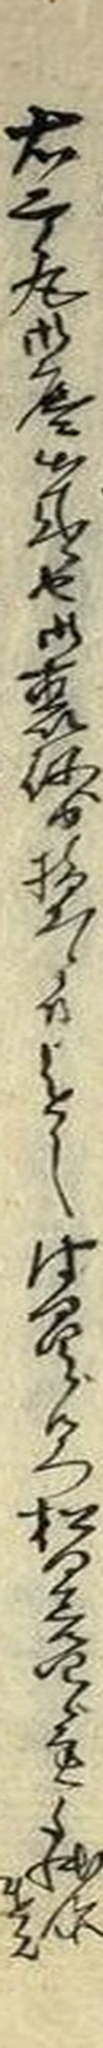右二之丸御庭出来候由御裏役ゟ指出候付被進之津田四郎右衛門松田善四郎方へ手紙添差出ス
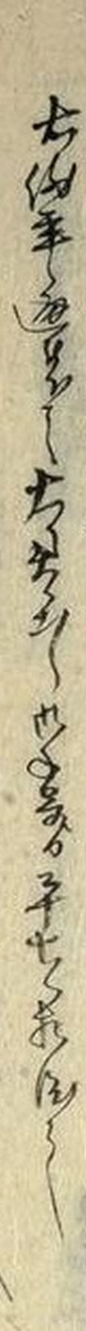右例年之通被下之大奥出候御年寄ゟ平七へ相渡之
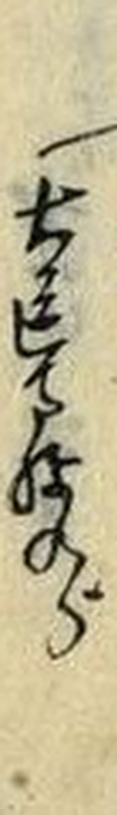大道寺孫九郎

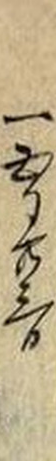一五月廿三日
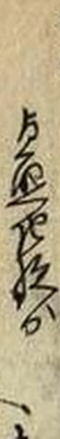貞照院様ゟ
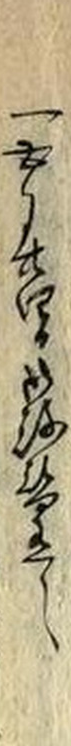一五月廿四日御役替有之
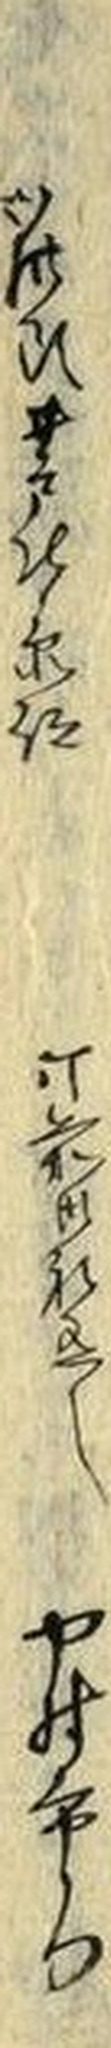御供頭井戸次兵衛跡御前御礼有之中村市右衛門
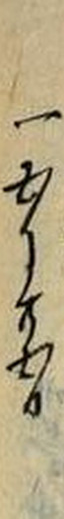一五月廿三日
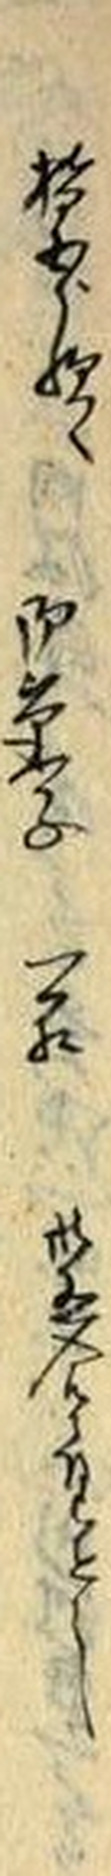揩五郎様へ御菓子一箱御有合ニ付被進之
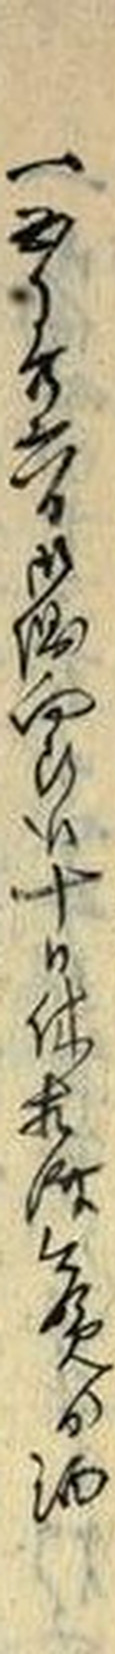一五月廿六日御側向頭取十日休相済今晩ゟ泊
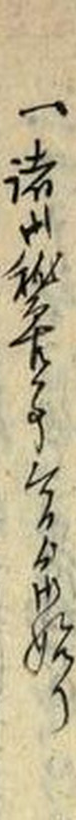一諸御稽古事今日ゟ御始り
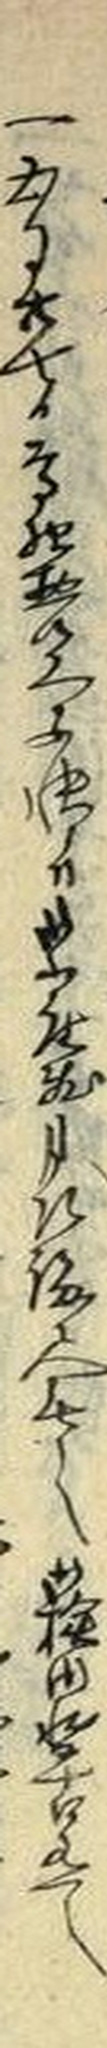一五月廿七日高野惣左衛門不快ニ付御小座敷月次講尺無之御槍御稽古有之
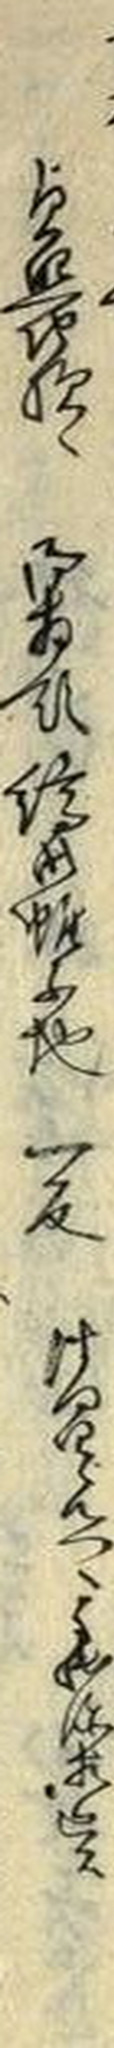貞照院様へ御拝領御縞御帷子地一反津田四郎左衛門へ手紙添相廻ス
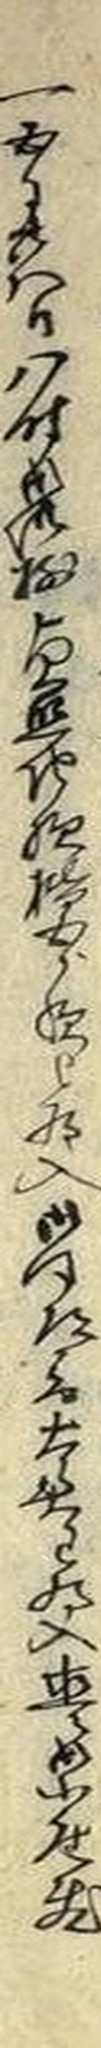一五月廿八日八時御供揃貞照院様揩五郎様被為入御同道ニ而大奥被為入直ニ御小座敷
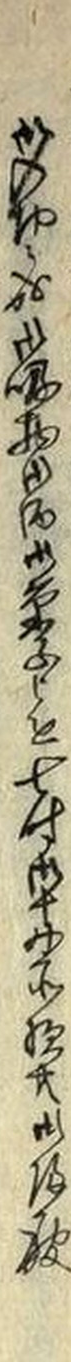御〆切ニ成御吸物御酒御菓子被進七時御両所様共御帰館
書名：少傅日録抄（斉承付側向頭取日記、在国）
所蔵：福井県文書館 Fukui Prefectural Archives
